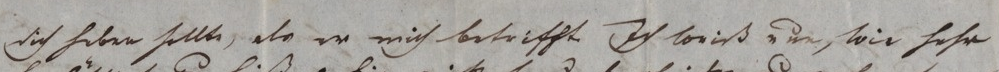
dich haben sollte, als er mich betrifft. Ich weiß nur, wie sehr
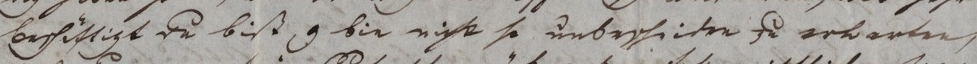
beschäftigt Du bist & bin nicht so unbescheiden zu erwarten,
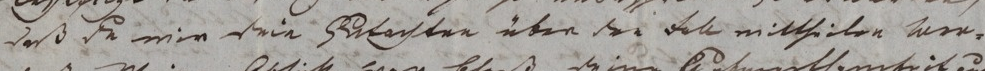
daß Du mir Dein Gutachten über den Fall mittheilen wer-
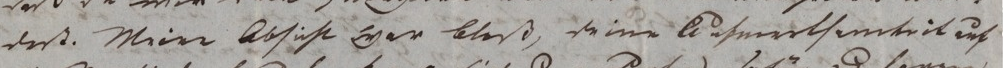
dest. Meine Absicht war bloß, Deine Aufmerksamkeit auf
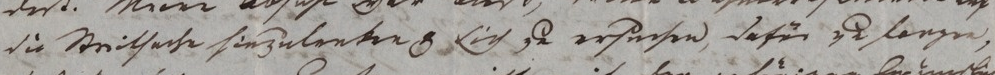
die Streitsache hinzulenken & dich zu ersuchen, dafür zu sorgen,
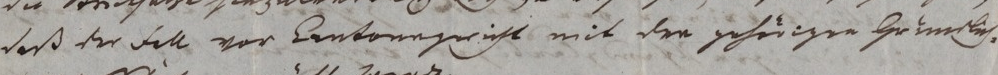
daß der Fall vor Cantonsgericht mit der gehörigen Gründlich-
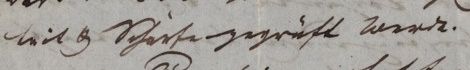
keit & Schärfe geprüft werde.
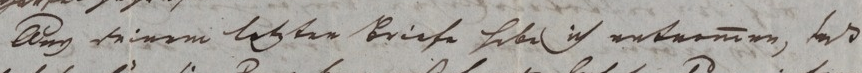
Aus Deinem letzten Briefe habe ich entnommen, daß
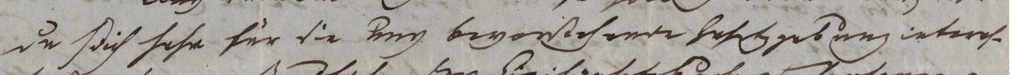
du dich sehr für die uns bevorstehende Gesetzgebung interes-
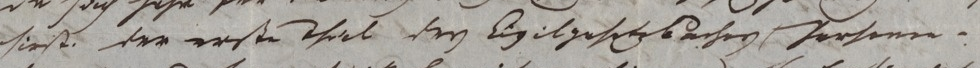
sirst. Der erste Theil des Civilgesetzbuches (Personen-
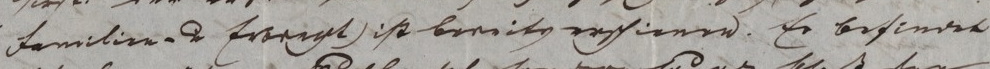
Familien- u Erbrecht) ist bereits erschienen. Er befindet
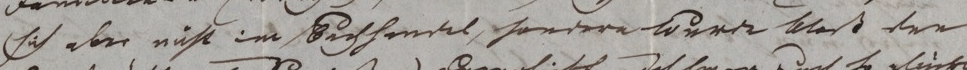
sich aber nicht im Buchhandel, sondern wurde bloß den
